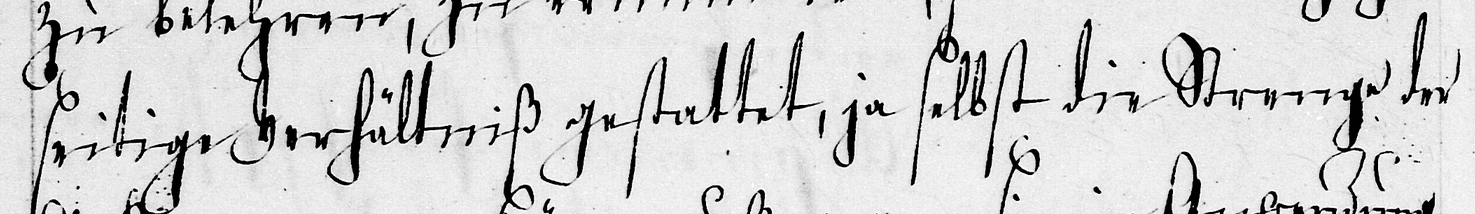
seitige Verhältniß gestattet, ja selbst die Strenge der
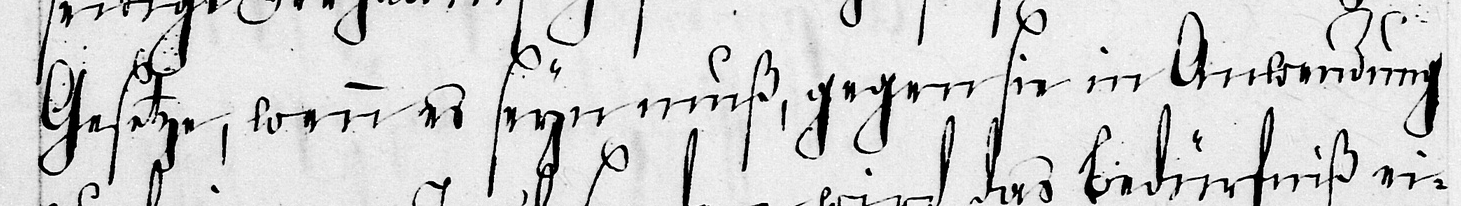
Gesetze, wenn es seyn muß, gegen sie in Anwendung
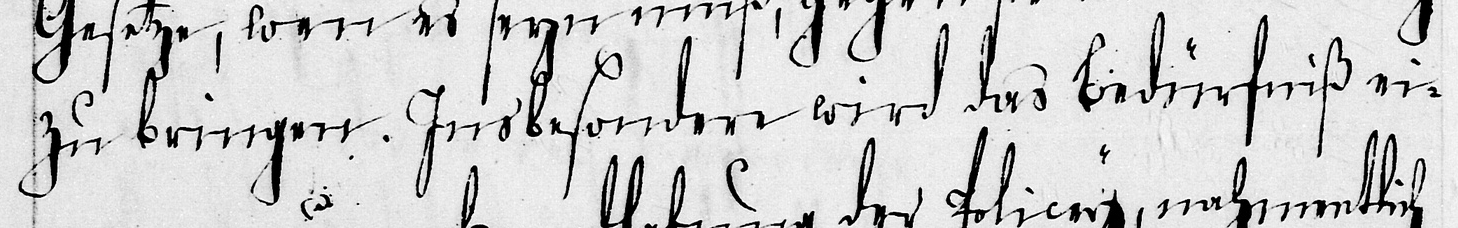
zu bringen. Insbesondere wird das Bedürfniß ei¬
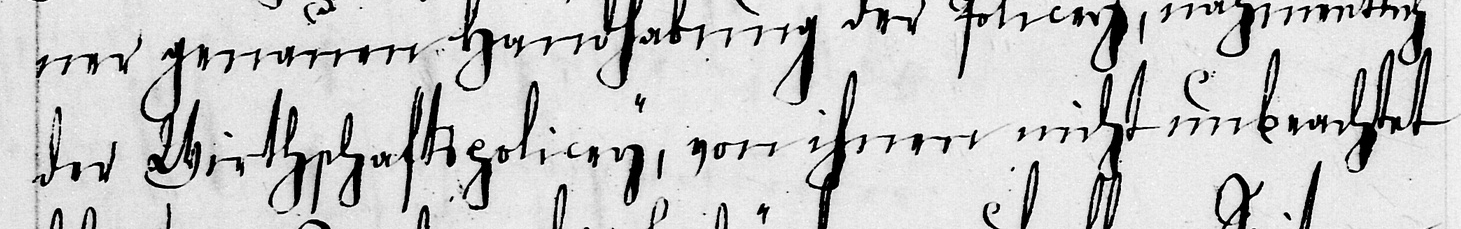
der Wirthschaftspolicey, von ihnen nicht unbeachtet
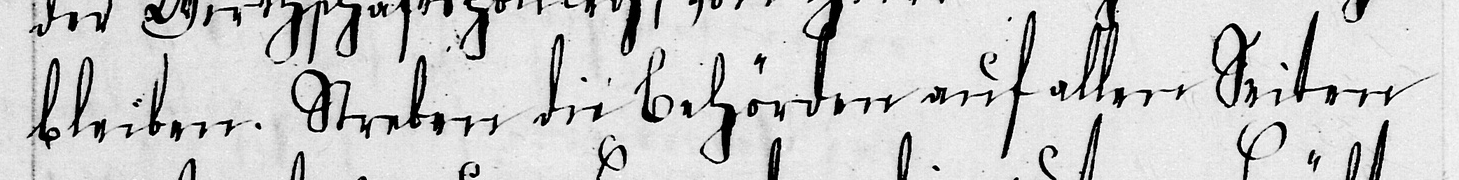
bleiben. Streben die Behörden auf allen Seiten
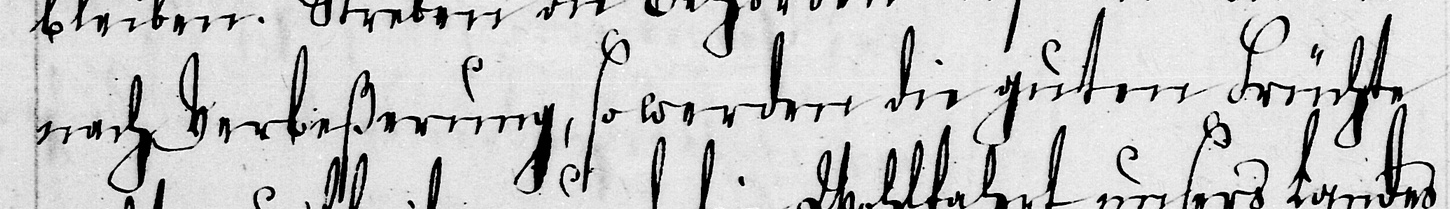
nach Verbeßerung, so werden die guten Früchte
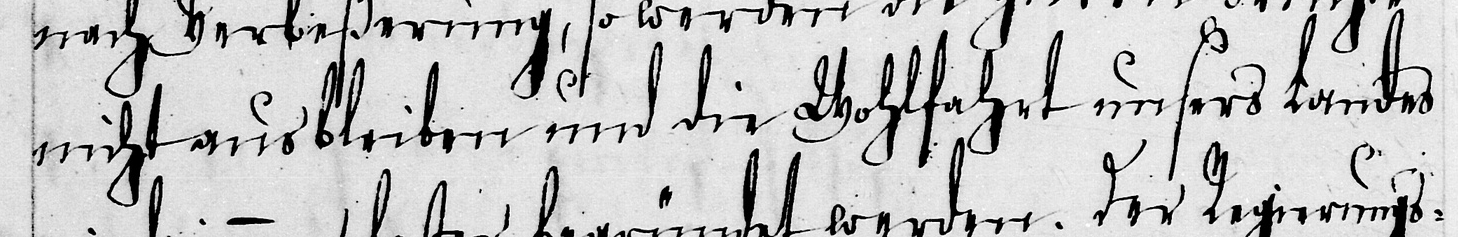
nicht ausbleiben und die Wohlfahrt unsers Landes
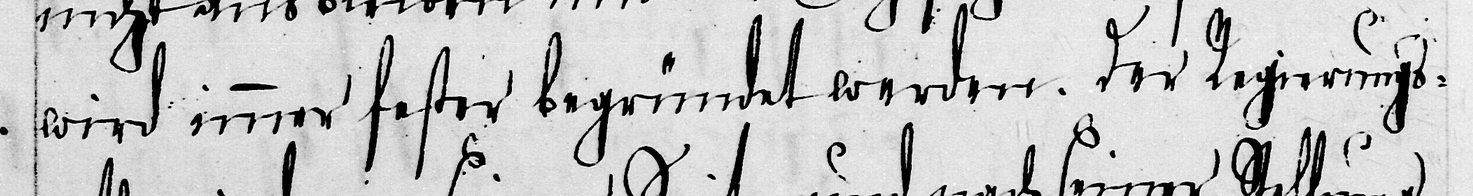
wird immer fester begründet werden. Der Regierungs¬
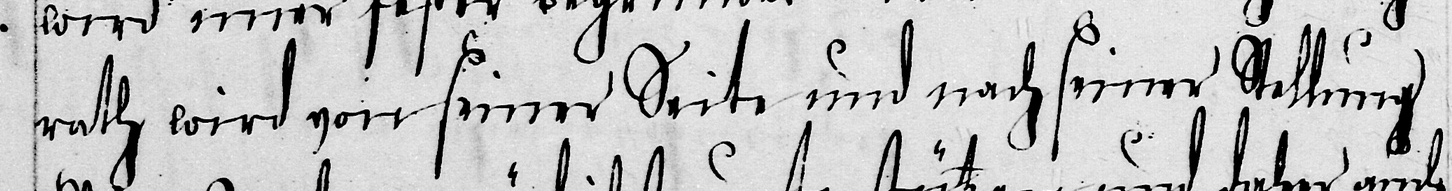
rath wird von seiner Seite und nach seiner Stellung
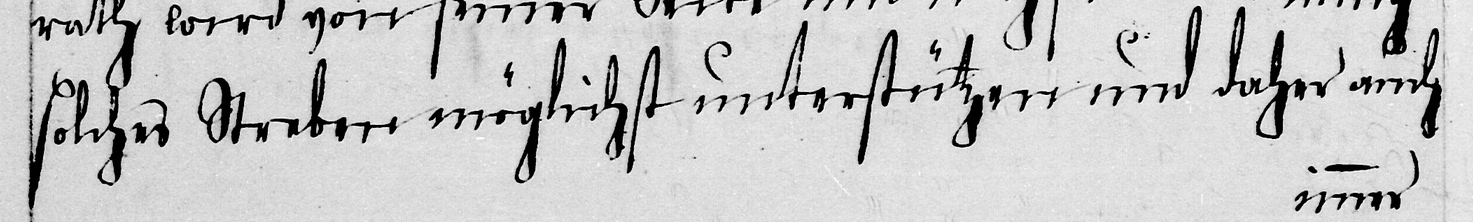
solches Streben möglichst unterstützen und daher auch
